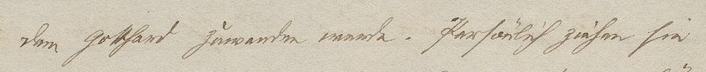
dem Gotthard zuwenden werde. Persönlich ziehen sie
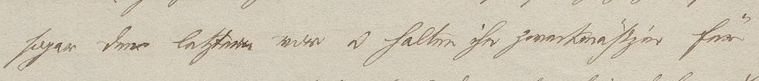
sogar den letztern vor & halten ihn zweckmäßiger für
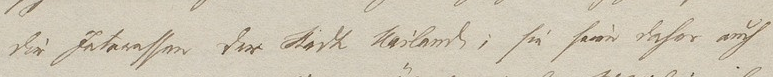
die Interessen der Stadt Mailand; sie seien daher auch
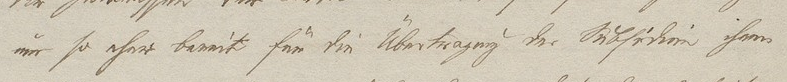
um so eher bereit für die Übertragung der Subsidien ihren
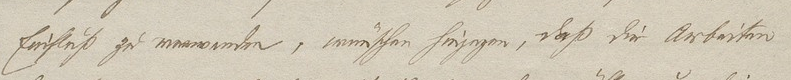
Einfluß zu verwenden, wünschen hingegen, daß die Arbeiten
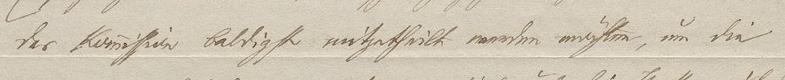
der Kommission baldigst mitgetheilt werden möchten, um die
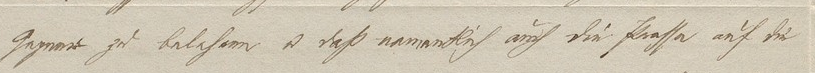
Gegner zu belehren & daß namentlich auch die Presse auf die
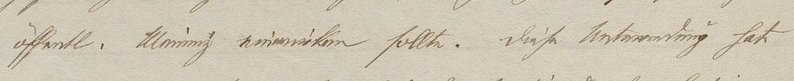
öffentl. Meinung einwirken sollte. Diese Unterredung hat
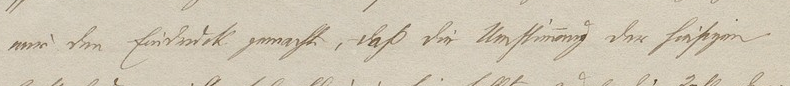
mir den Eindruck gemacht, daß die Umstimmung der hiesigen
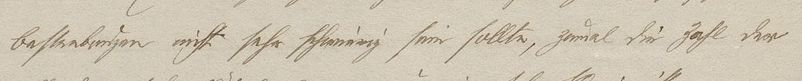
Bestrebungen nicht sehr schwierig sein sollte, zumal die Zahl der
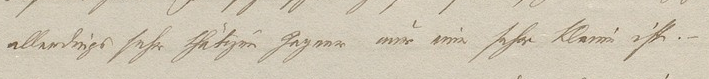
allerdings sehr thätigen Gegner nur eine sehr kleine ist. –
